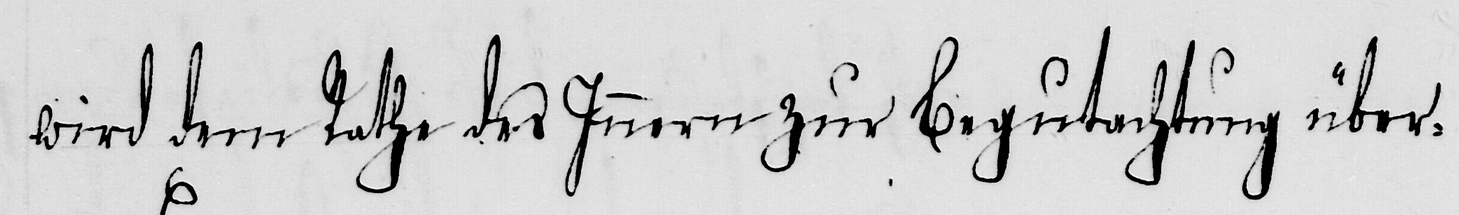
wird dem Rath des Innern zur Begutachtung über¬
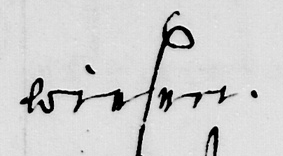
wiesen.
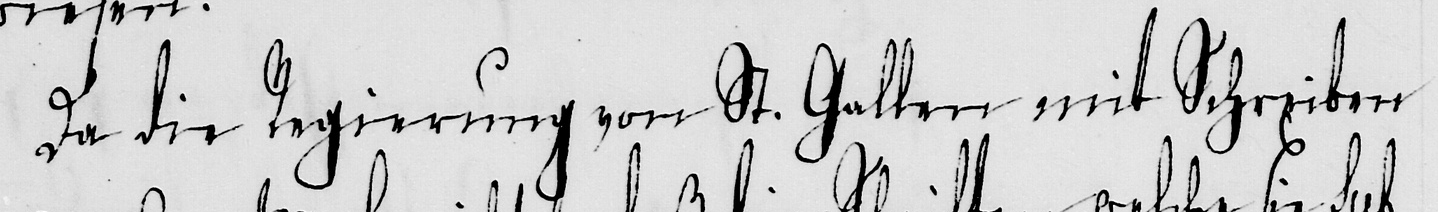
Da die Regierung von St. Gallen mit Schreiben
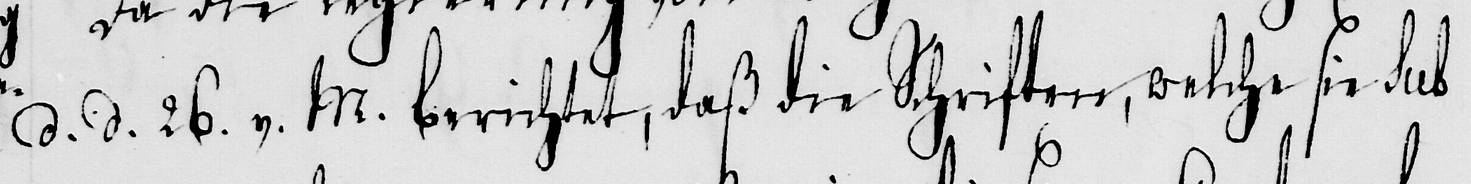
d. d. 26. v. M. berichtet, daß die Schriften, welche sie sub
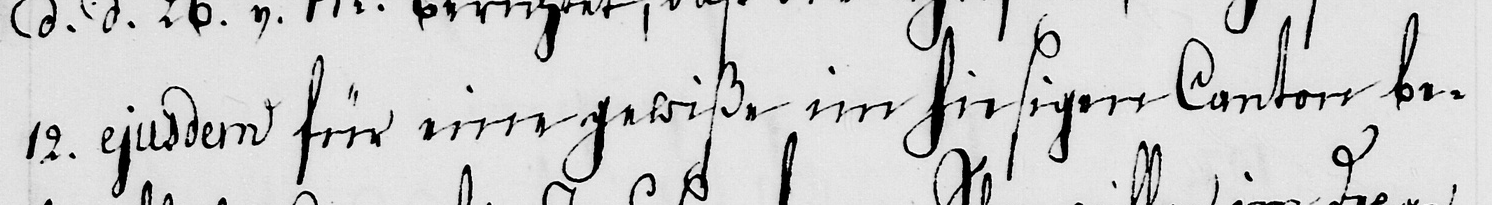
12. ejusdem für eine gewiße im hiesigen Canton be¬
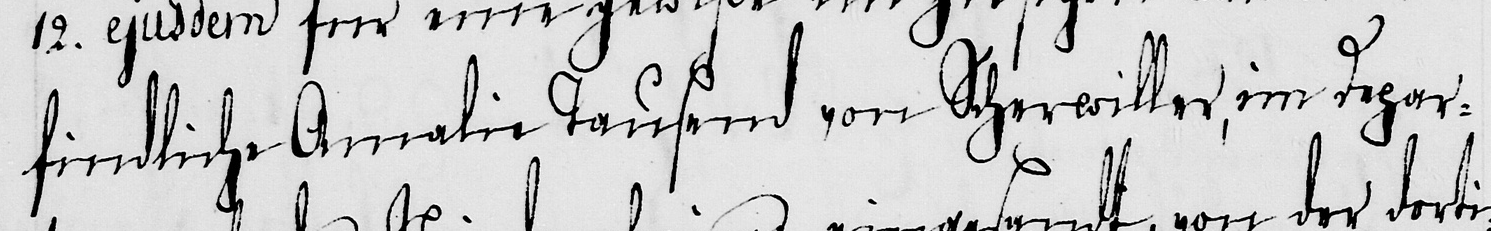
findliche Amalie Tausend von Scherwiller, im Depar¬
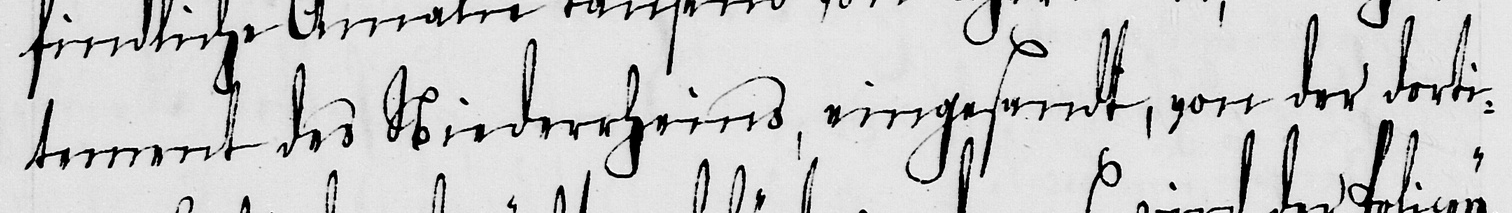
tement des Niederheims, eingesandt, von der dorti¬
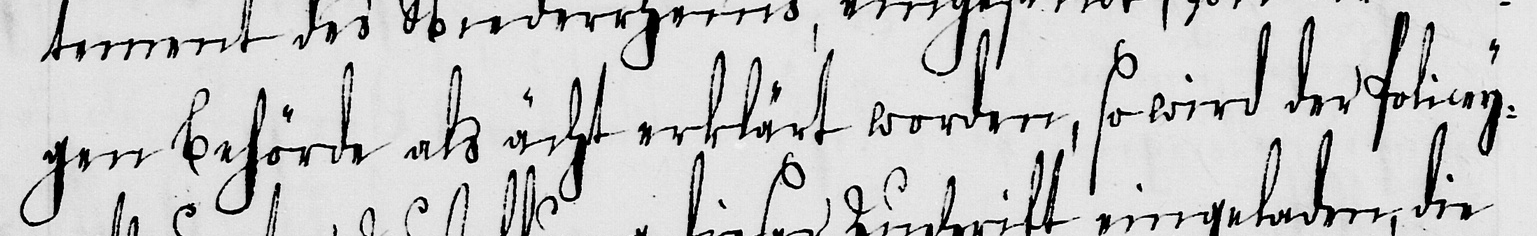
gen Behörde als ächt erklärt worden, so wird der Police¬
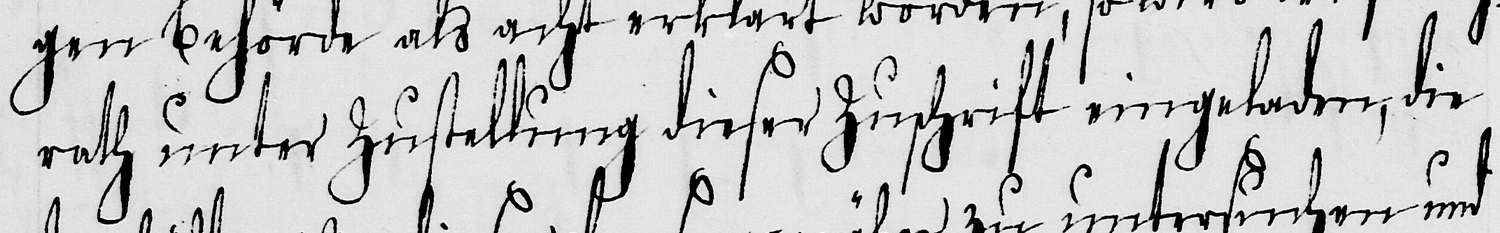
rath unter Zustellung dieser Zuschrift eingeladen, die
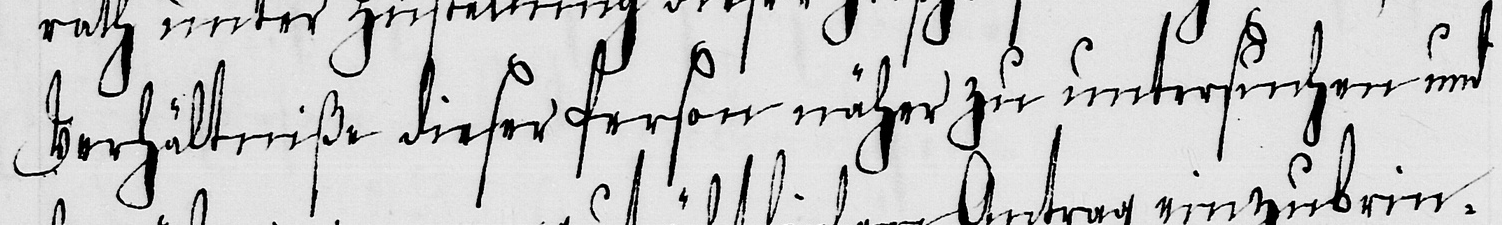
Verhältniße dieser Person näher zu untersuchen und
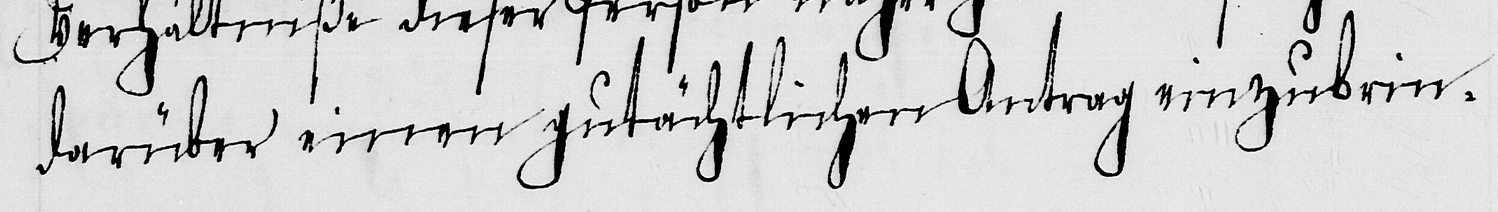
darüber einen gutächtlichen Antrag einzubrin¬
